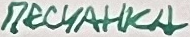песчанка
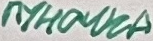пуночка
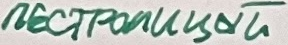пестролицый
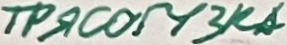трясогузка
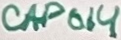сарыч
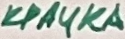крачка
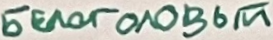белоголовый
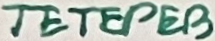тетерев
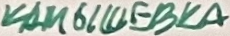камышевка
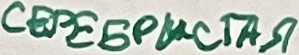серебристая
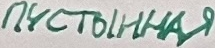пустынная
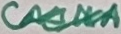саджа
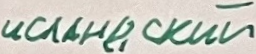исландский
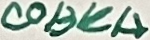содка
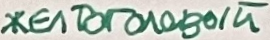желтоголовый
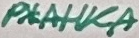ржанка
